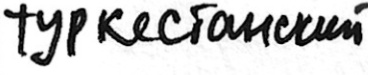туркестанский
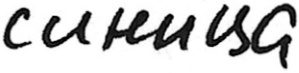синица
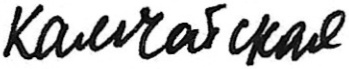камчатская
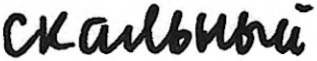скальный
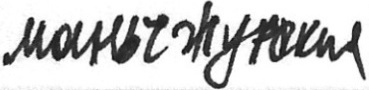маньчжурския
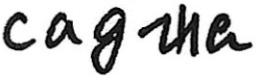саджа
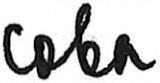сова
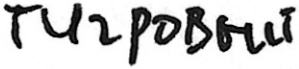тигровый
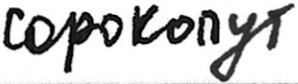сорокопут
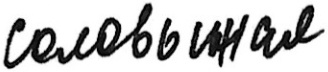соловьиная
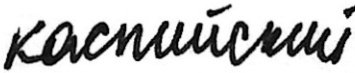каспийский
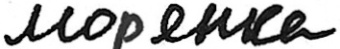морянка
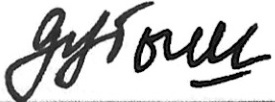дутыш
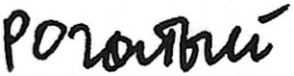рогатый
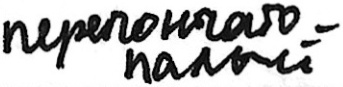перепончато-палый
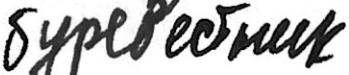буревестник
